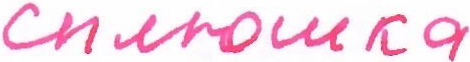сплюшка
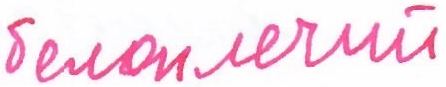белоплечий
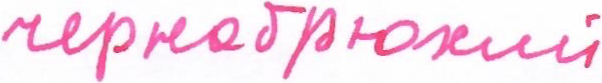чернобрюхий
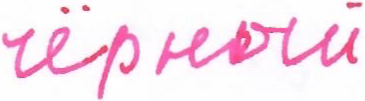чёрный
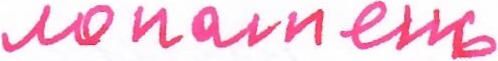лопатень
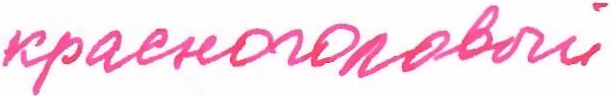красноголовый
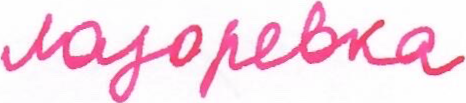лазоревка
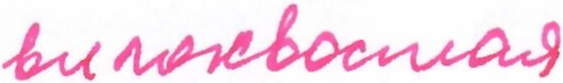вилохвостая
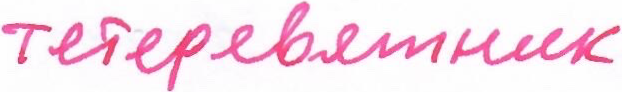тетеревятник
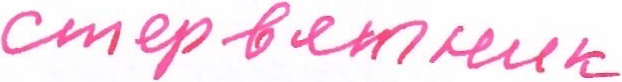стервятник
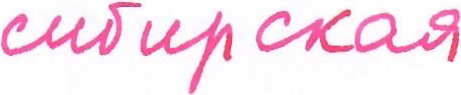сибирская
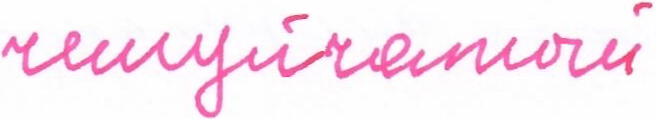чешуйчатый
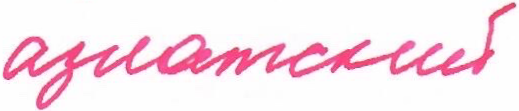азиатский
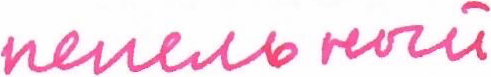пепельный
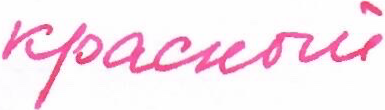красный
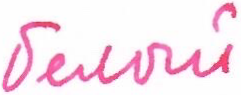белый
